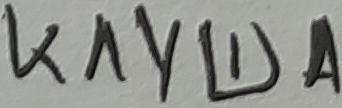клуша
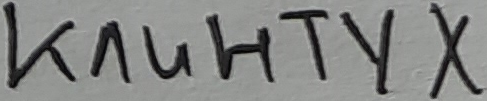клинтух
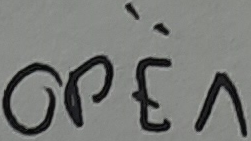орёл
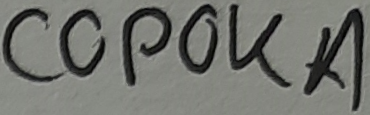сорока
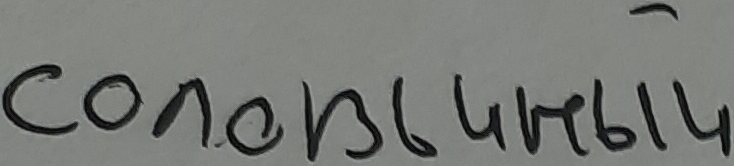соловьиный
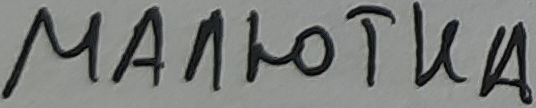малютка
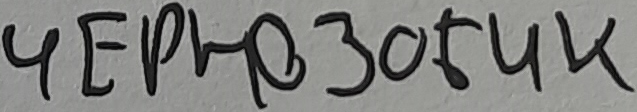чернозобик
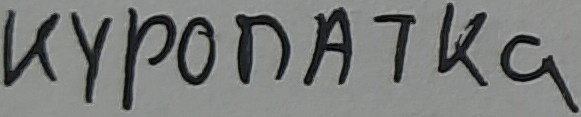куропатка
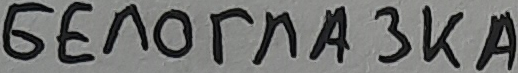белоглазка
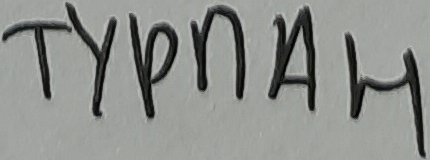турпан
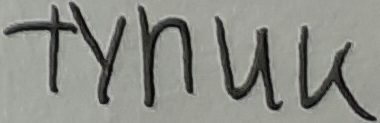тупик
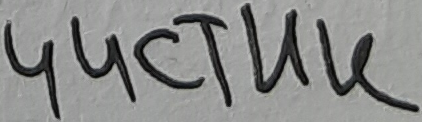чистик
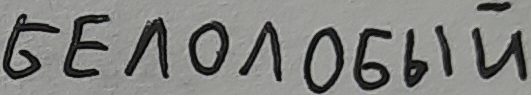белолобый
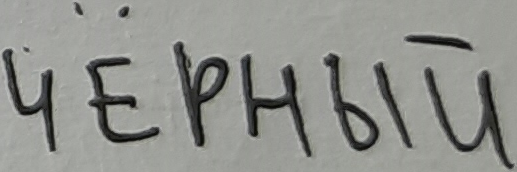чёрный
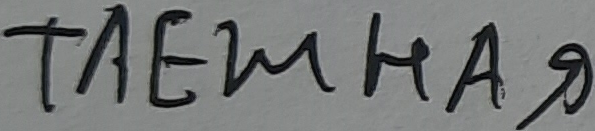таежная
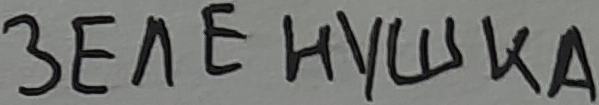зеленушка
